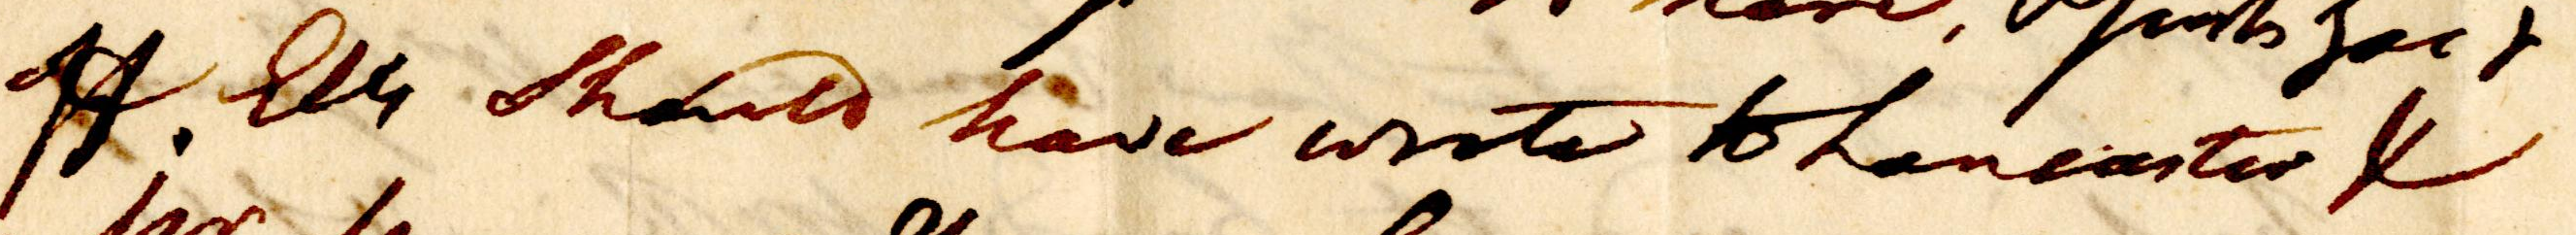of Ells Should have wrote to Lancaster &
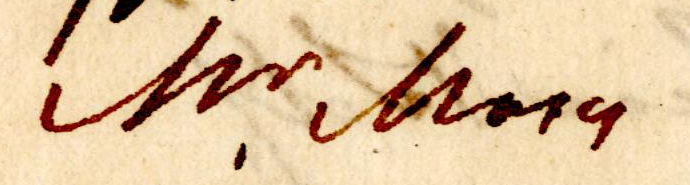M^r Moses
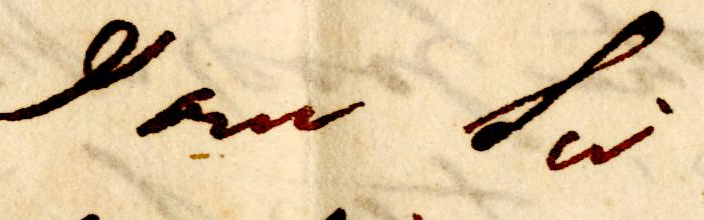I am Sir
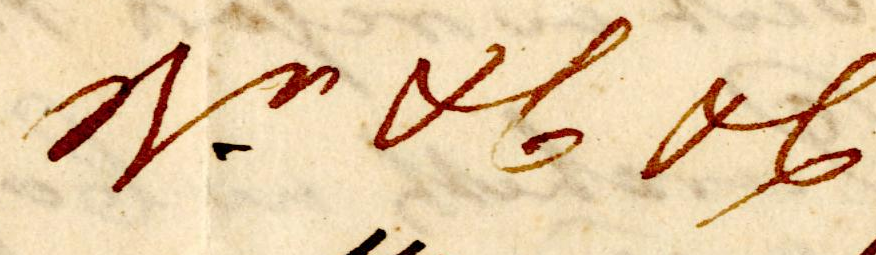y^r. &C &C
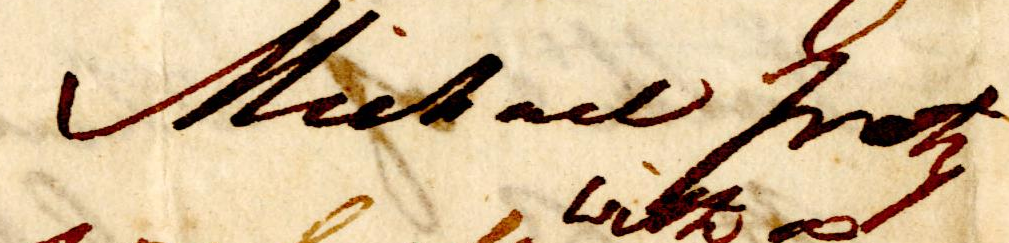Michael Gratz
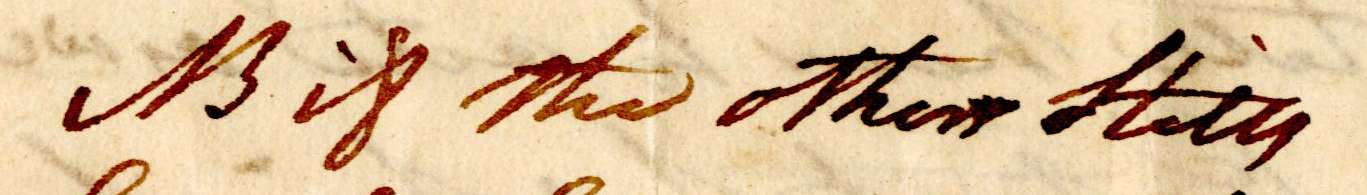NB if the other Stills
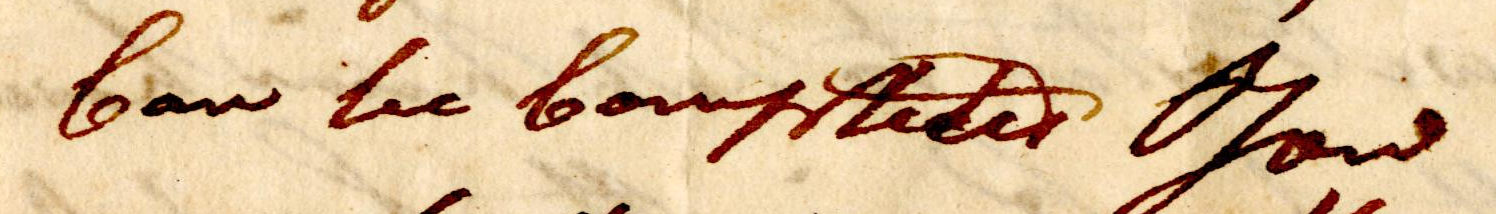Can be compleder you
